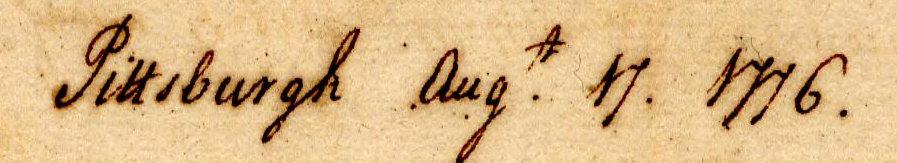Pittsburgh Aug^t. 17. 1776.
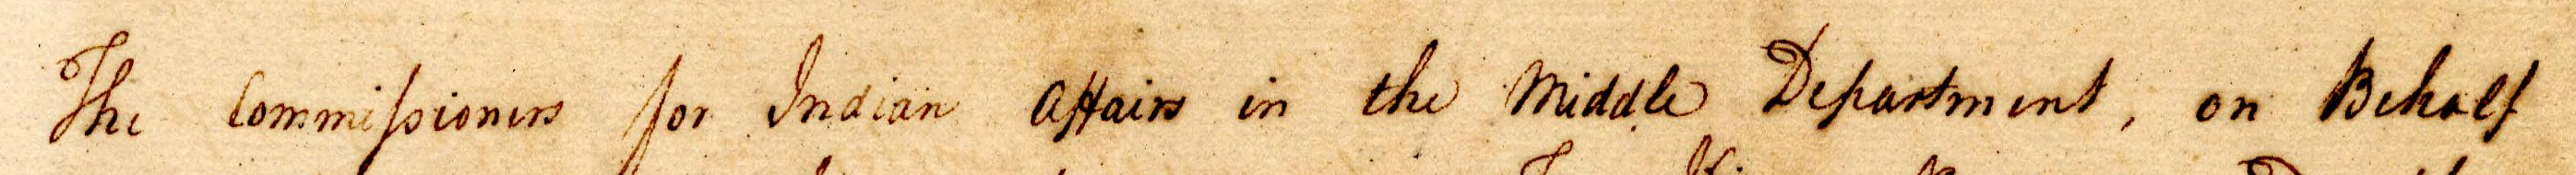The Commissioners for Indian Affairs in the Middle Department, on Behalf
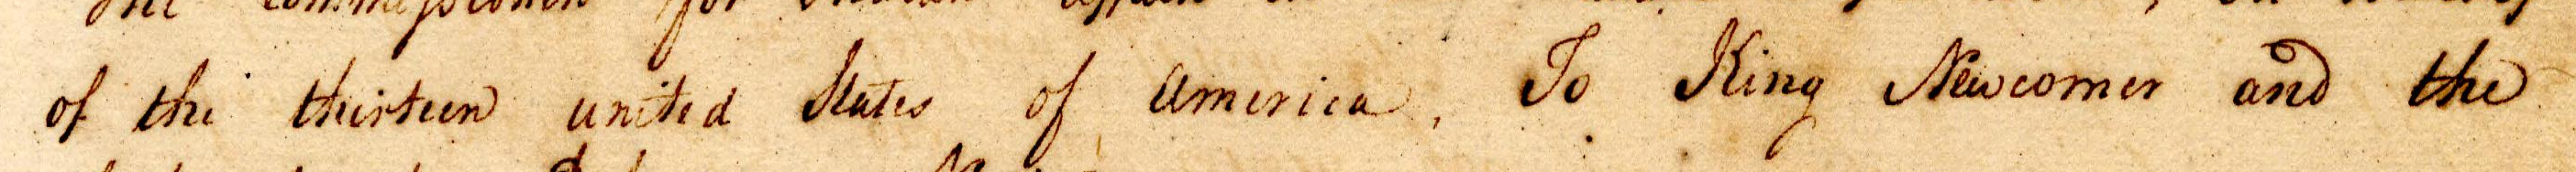of the thirteen united States of America. To King Newcomer and the
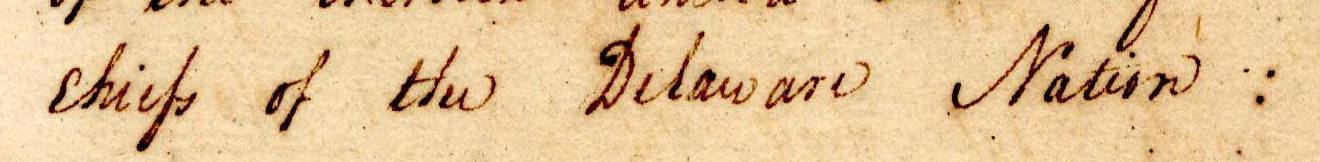chiefs of the Delaware Nation:
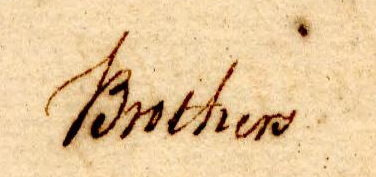Brothers
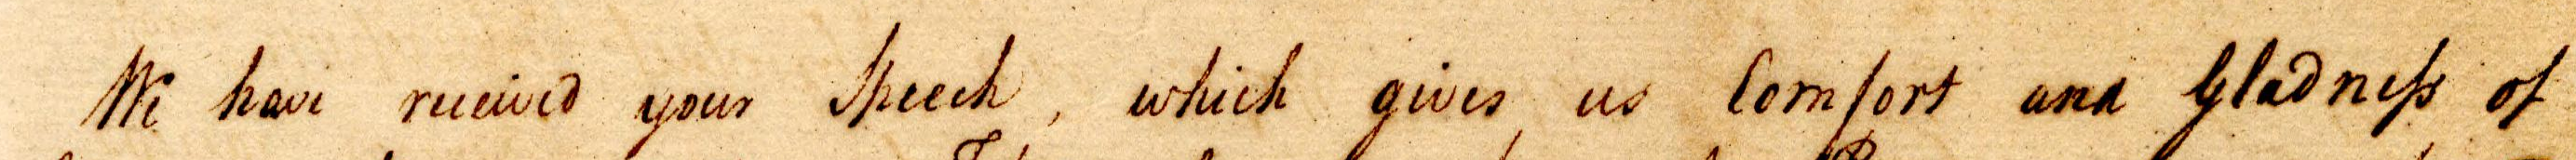We have received your Speech, which gives us Comfort and Gladness of
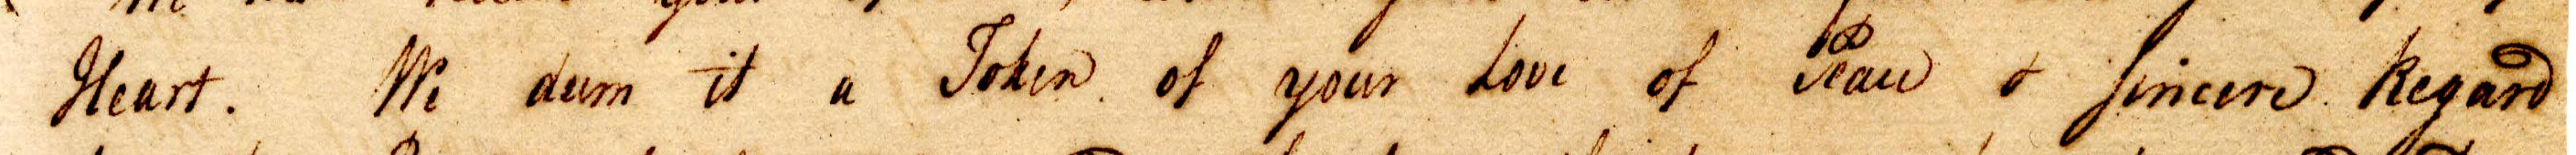Heart. We deem it a Token of your Love of Peace & Sincere Regard
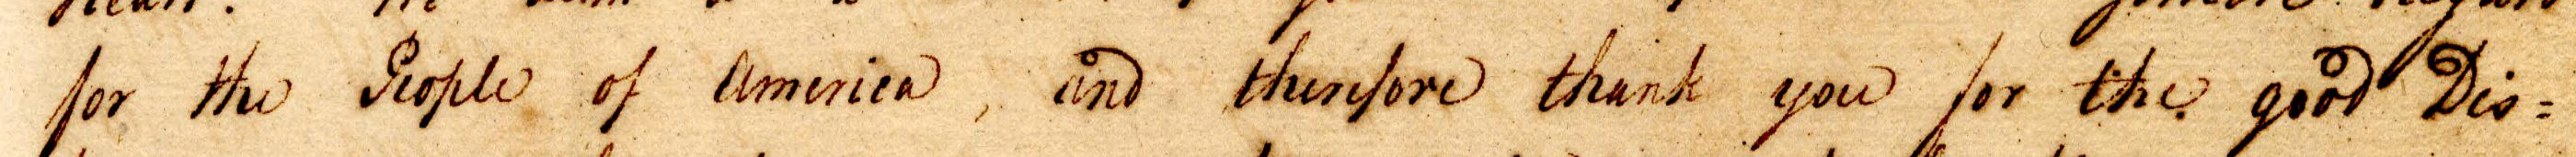for the People of America, and therefore thank you for the good Dis-
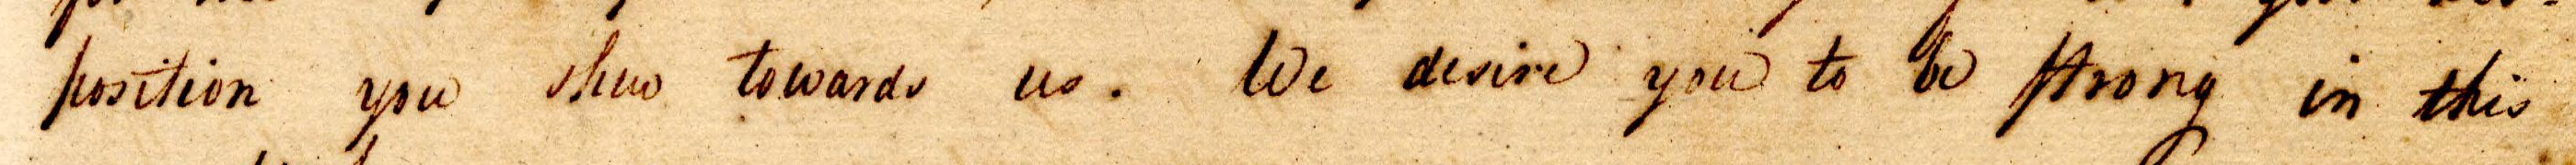position you shew towards us. We desire you to be strong in this
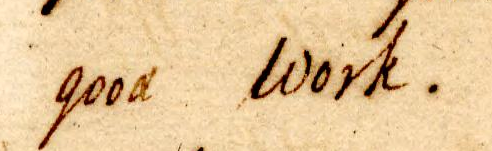good Work.
